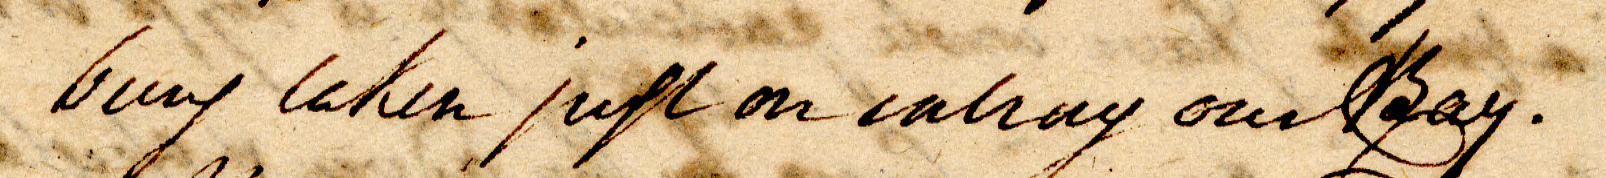being taken just on entrng our Bay
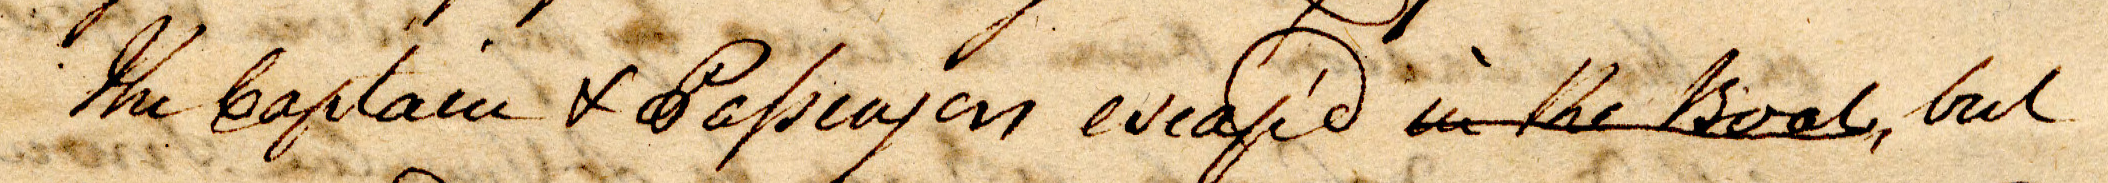The Captain & Passengers escap'd [in the Boat], but
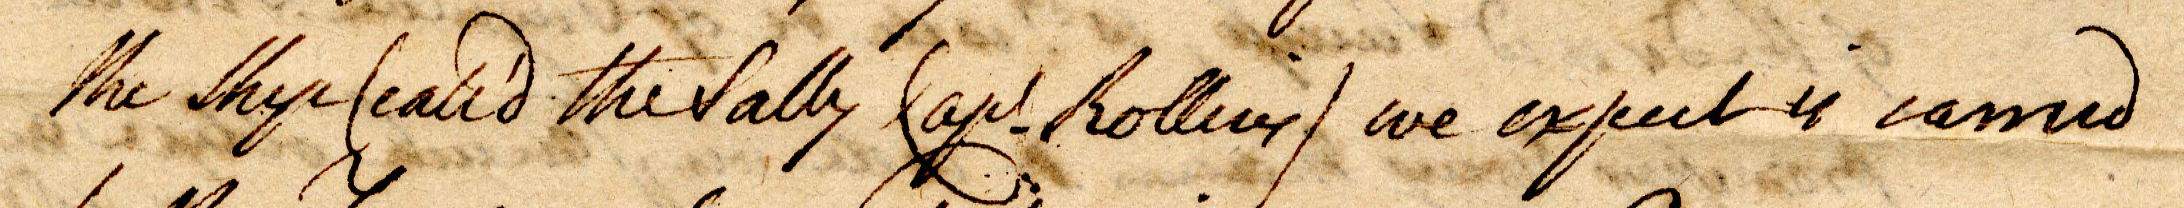the ship (call'd the Sally Cap^t. Rollins) we expect is carried
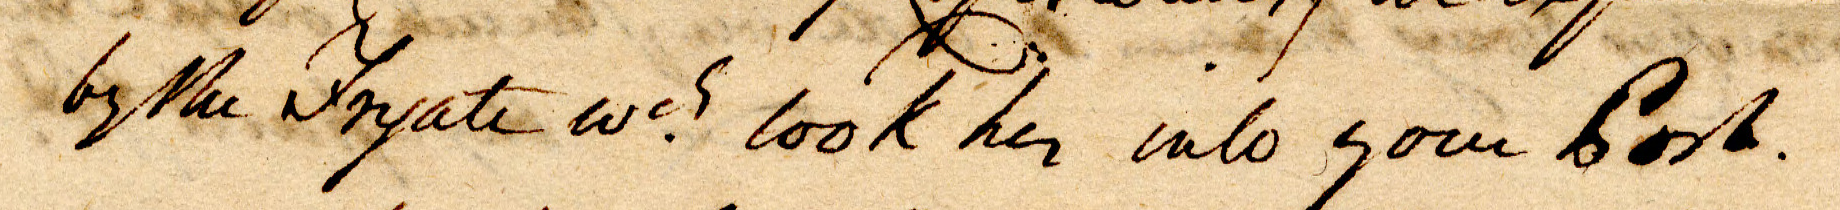by the Frigate w^ch. took her into your Port.
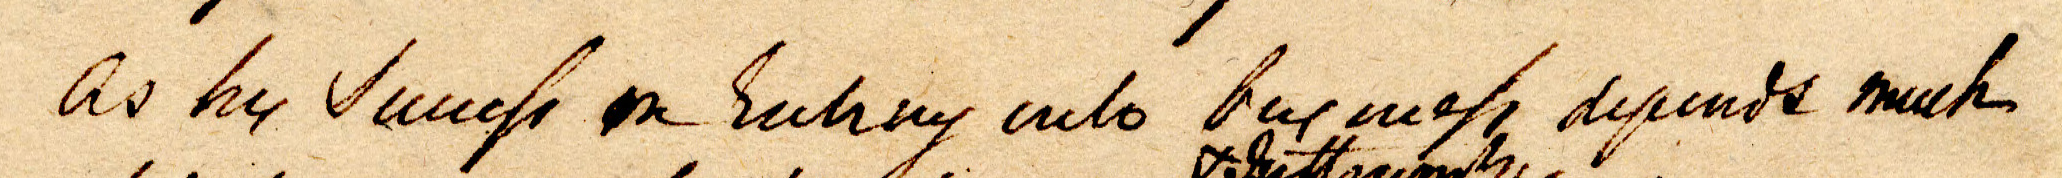As his Success on Entry into Business depends much
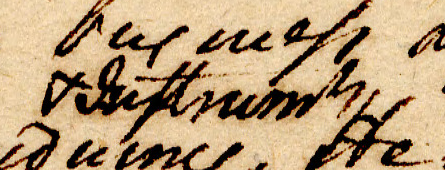& Instrum^ts
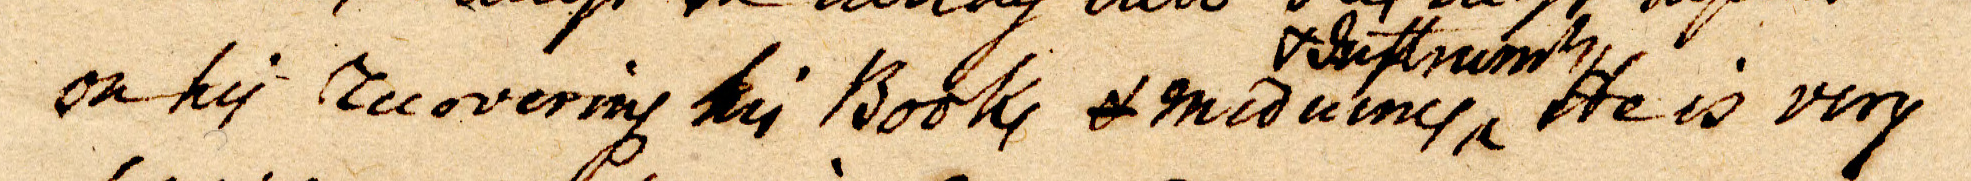on his recovering his Books & Medicines ^ He is very
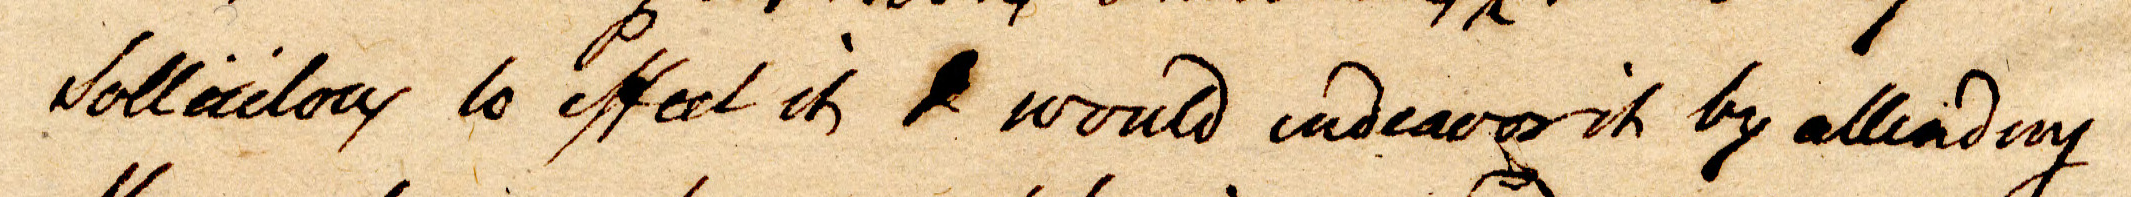Sollicitous to effect it & would indeavor it by attending
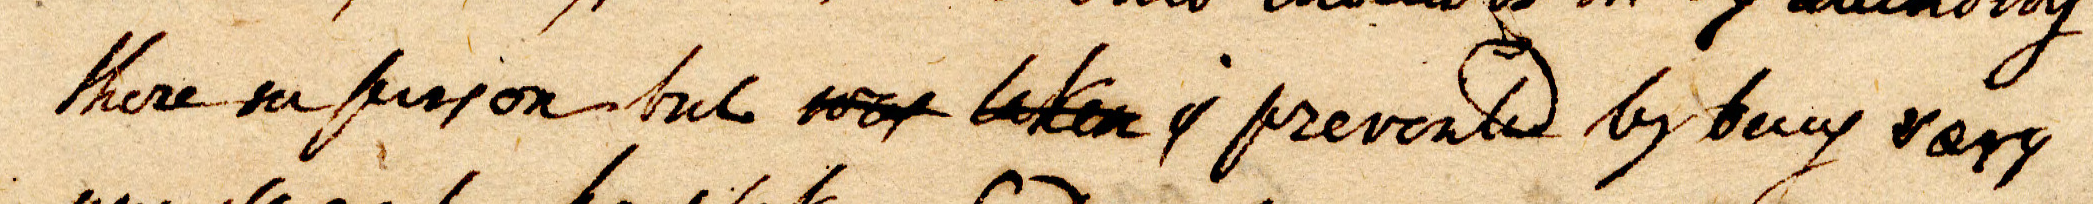there in person but is prevented by being very
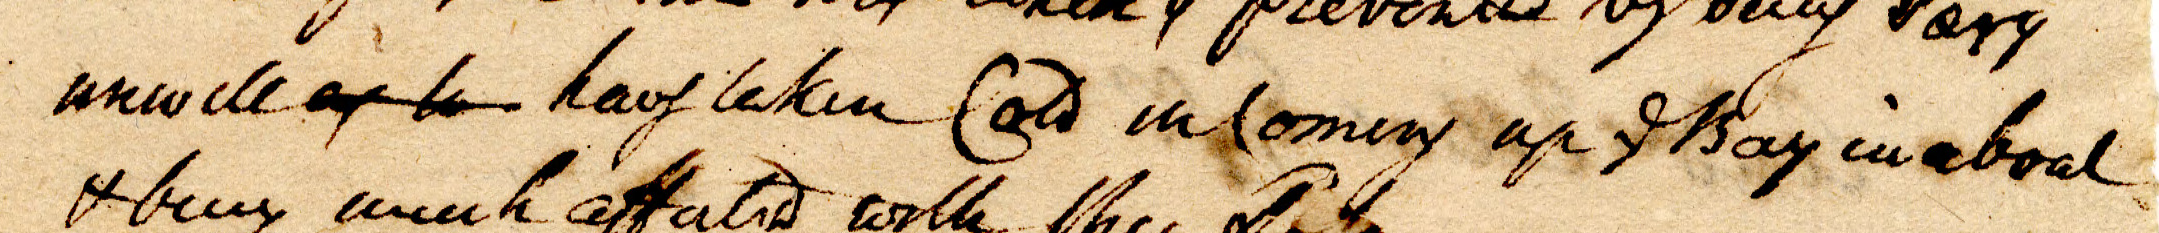unwell [as he] havg taken Cold in coming up y^e Bay in a boat
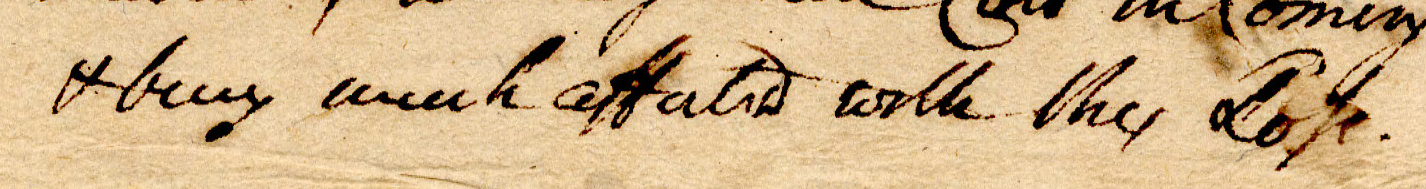& being much affected with the Loss.
